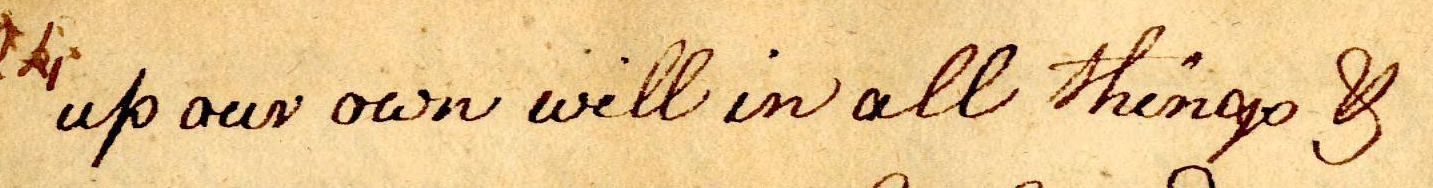up our own will in all things &
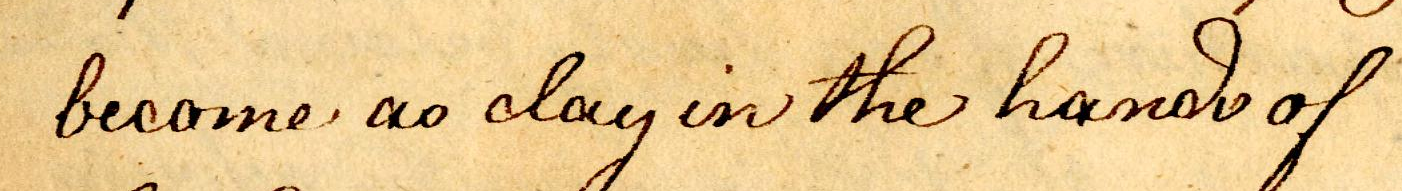become as clay in the hands of
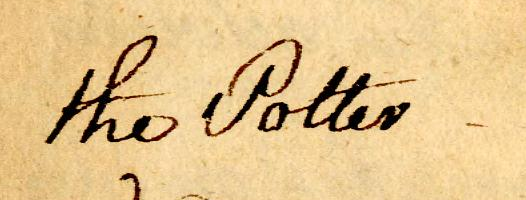the Potter-
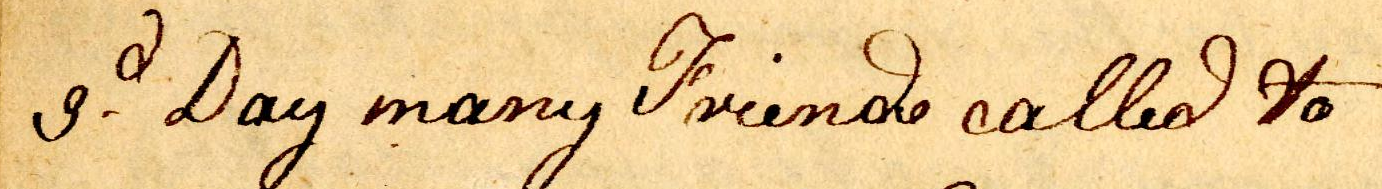3^d Day many Friends called to
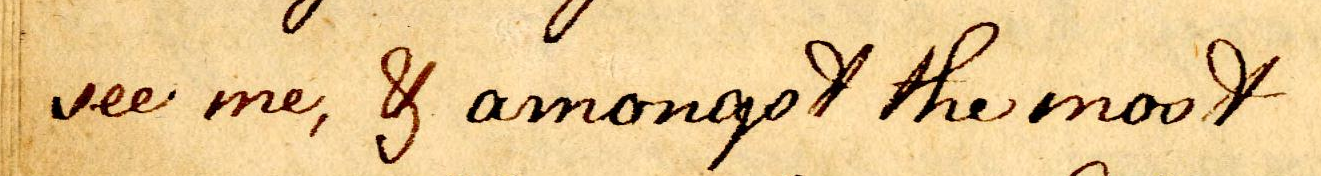see me, & amongst the most
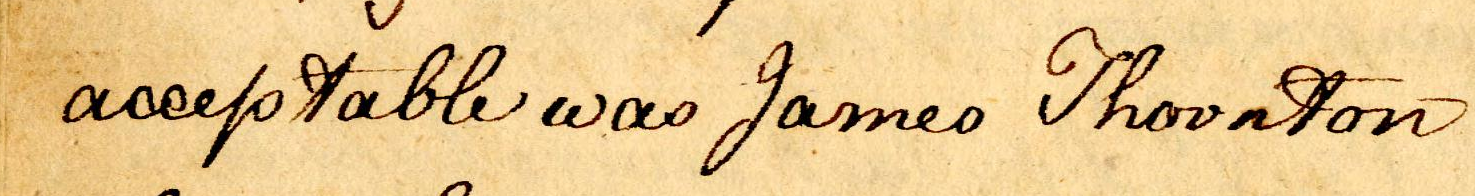acceptable was James Thornton
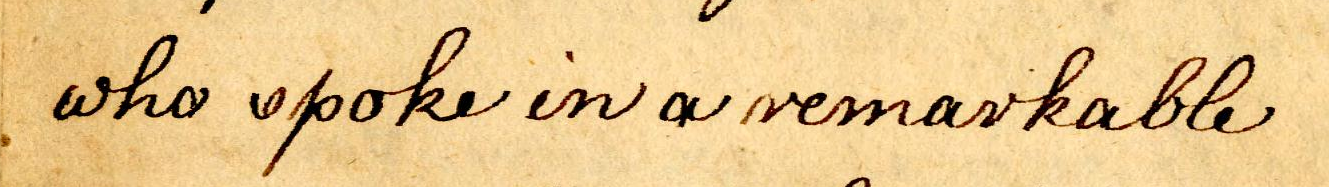who spoke in a remarkable
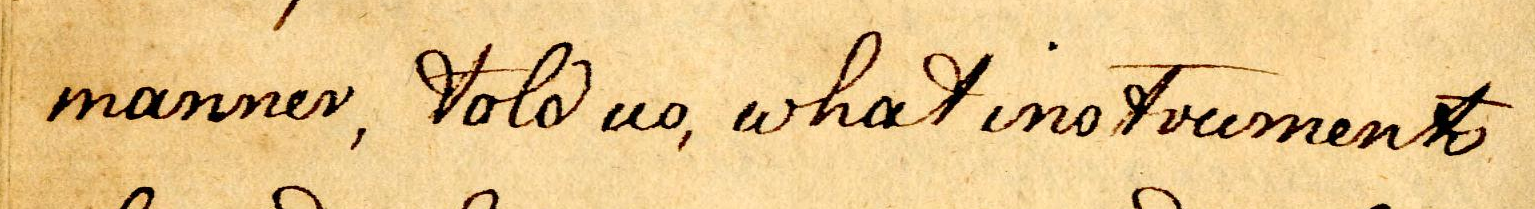manner, told us, what instruments
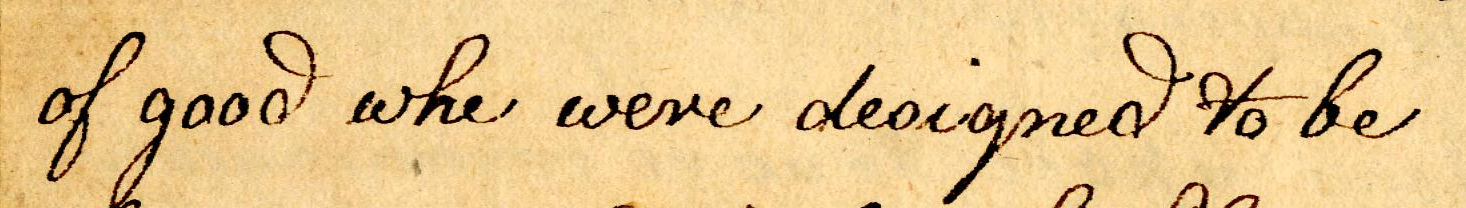of good whe were designed to be
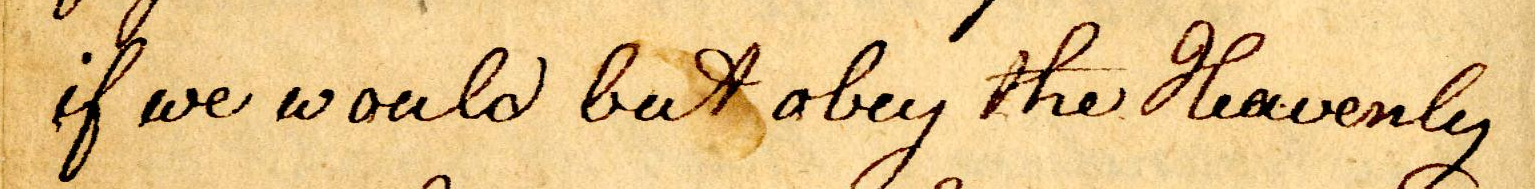if we would but obey the Heavenly
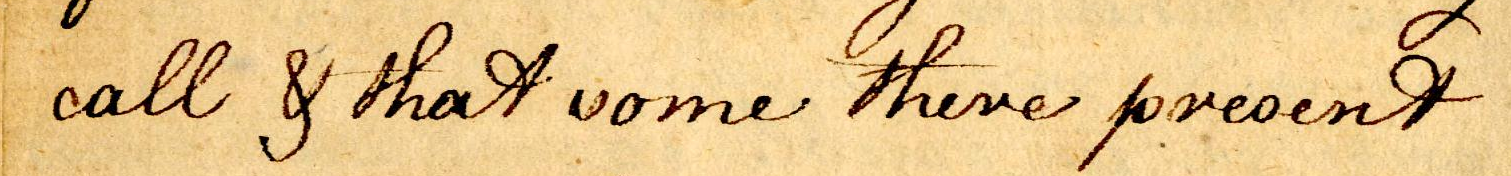call & that some there present
